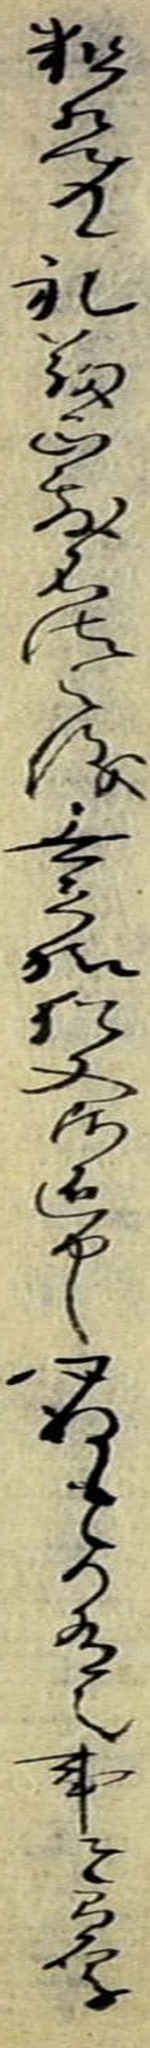粗相聞候礼義正敷不法之儀無之様猶又師匠中心得も可有之事に候間厚
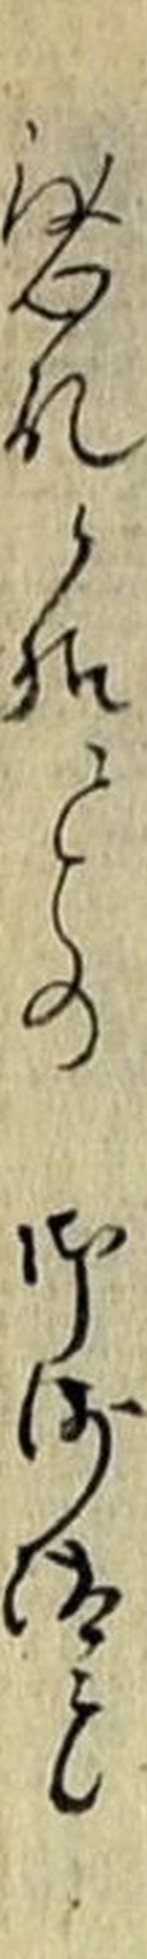致心糺候様にとの御沙汰に候
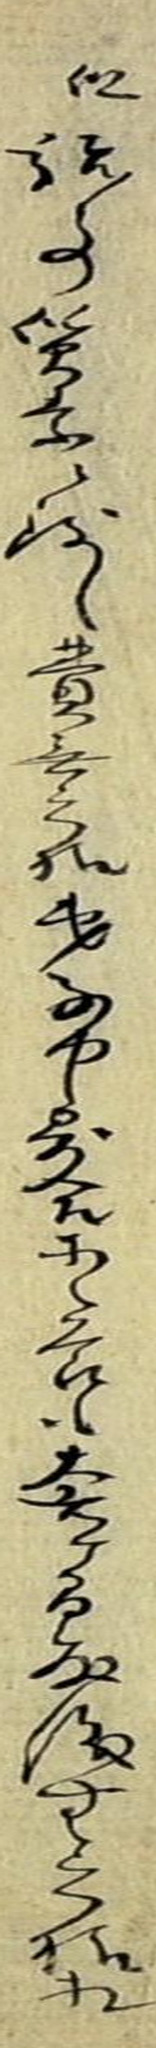但諸事質素に致費無之様弟子中寄合等之節も奢ヶ間敷儀無之様相
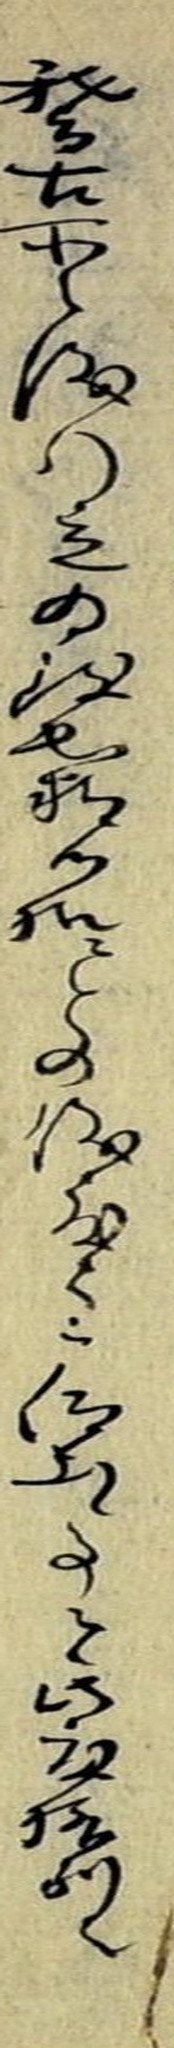稽古所之儀引立可致出精候様にとの儀度々被仰出候事に候此度格別之
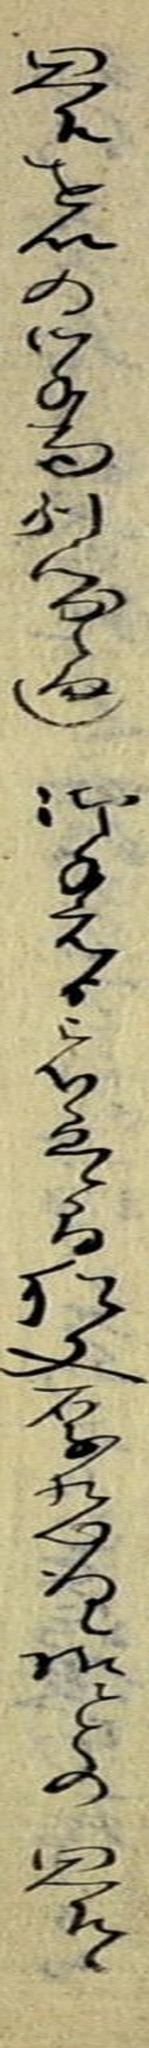思召を以可御手当別紙之通御手元ゟ被下置候間猶又厚相心得候様との思召候
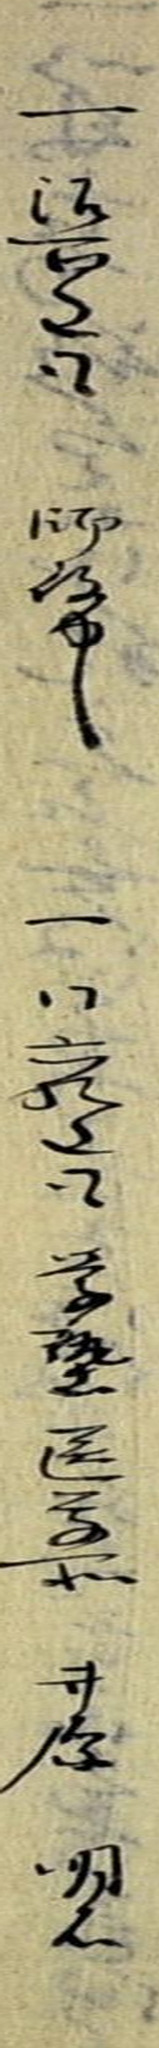一銀百匁つヽ師役中一同六拾匁ツヽ学藝医学所井原明石
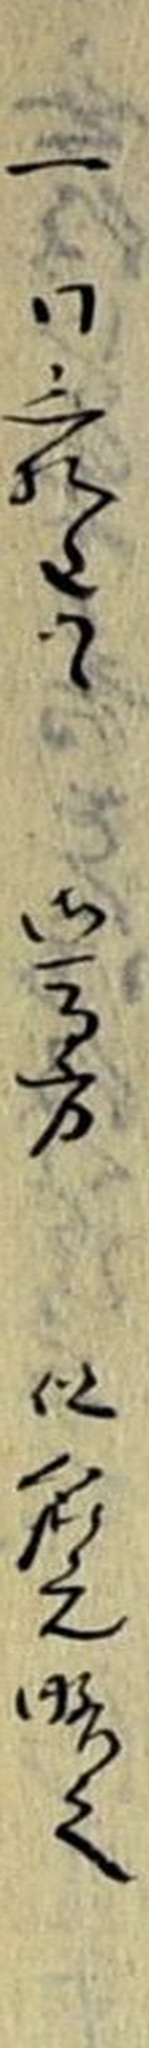一同三拾匁つヽ御馬方但名元略之
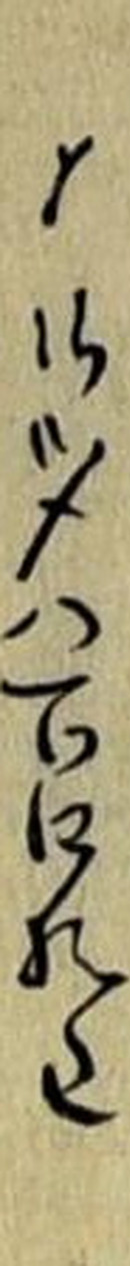〆銀二貫八百四拾匁
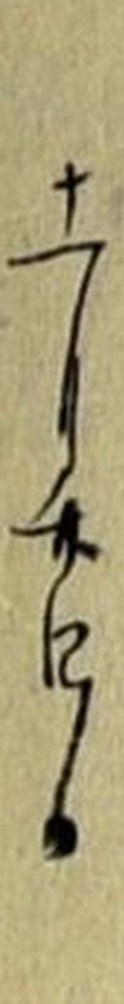十一月廿四日
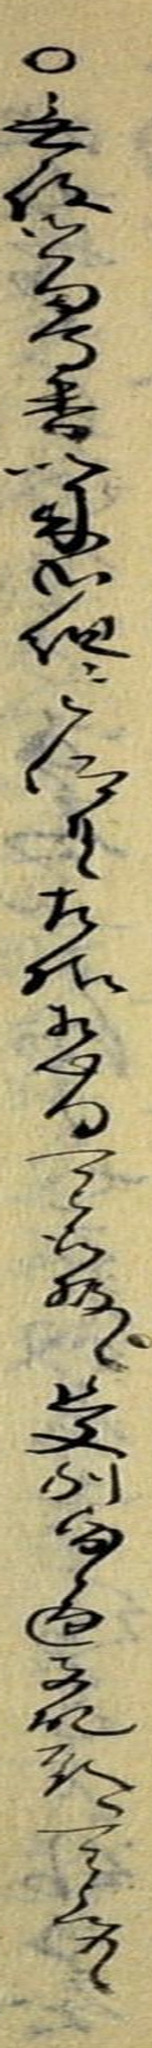○無役御留守番以来弐組に被仰付候左様相心得可被取扱候且又別紙之通支配頭へ可被申聞候
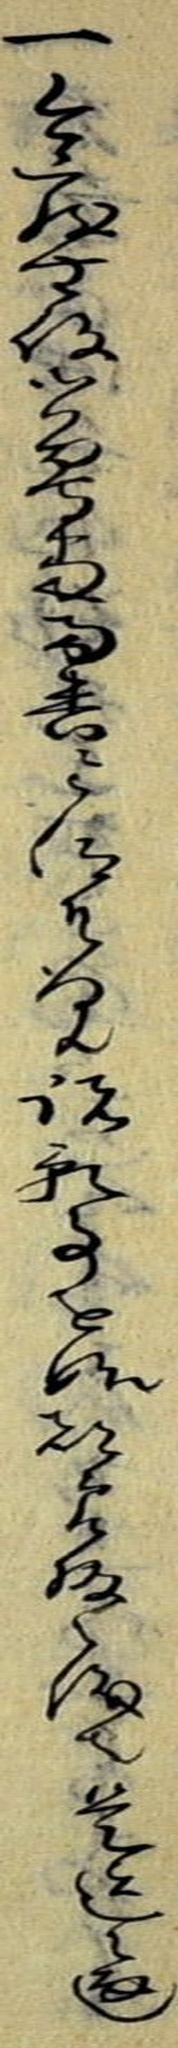一此度無役御留守役番当番に被仰付候得共諸願事を始都而取扱之儀は是迄之通
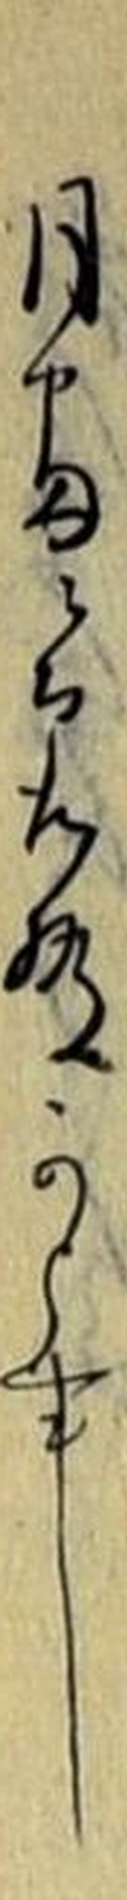月番に而取扱可申事
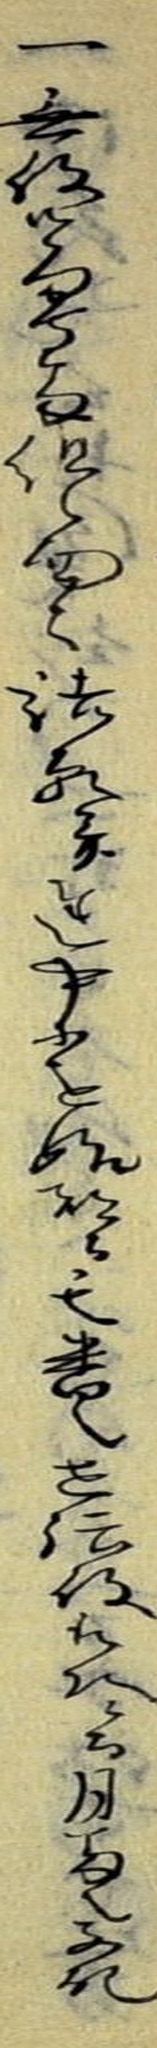一無役御留守番組之面々諸願并達事等を始都而其番之世話役取次に而月番之支配
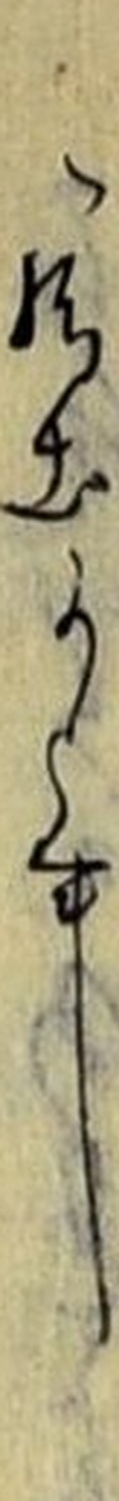へ指出可申事
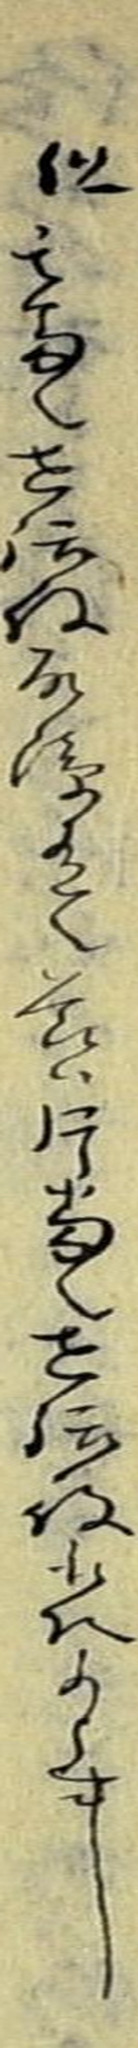但其番之世話役故障有之節は片番之世話役取次可申事
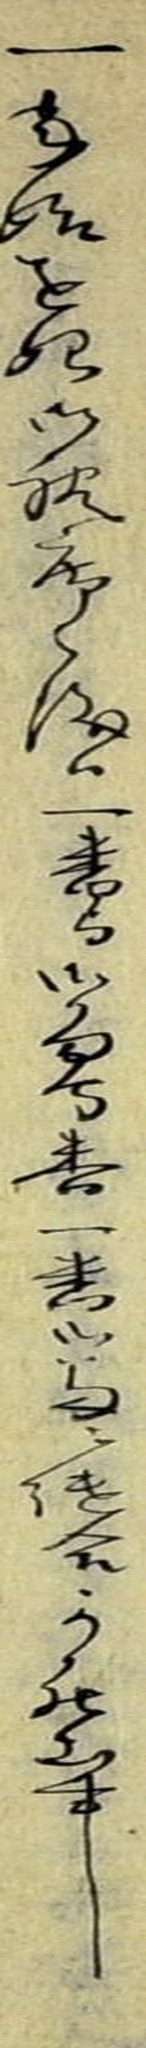一年始を始御礼席之儀は一番と御留守番一番弐番に継合可被罷出事
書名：命令之部 四
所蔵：福井県文書館 Fukui Prefectural Archives
